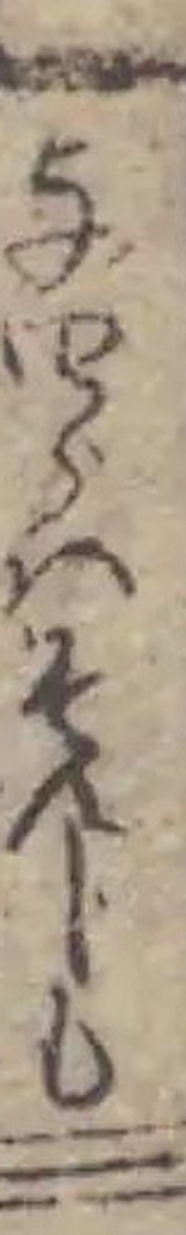与四郞はそんじも
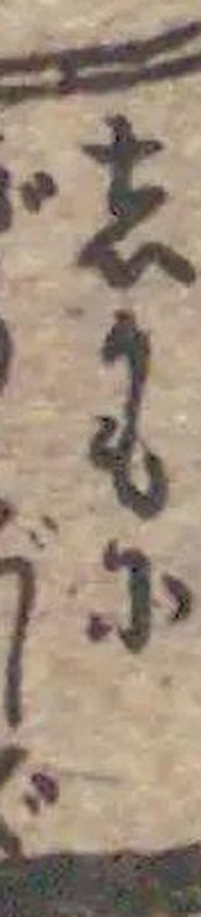しかもに
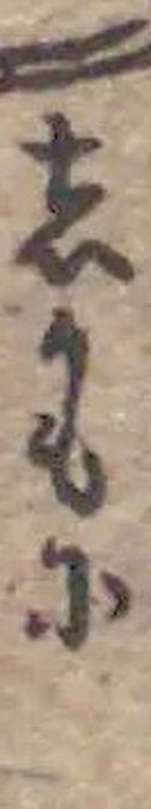しかもに
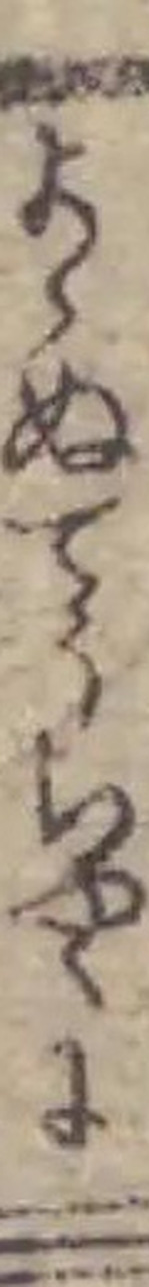よらぬてうちやくに
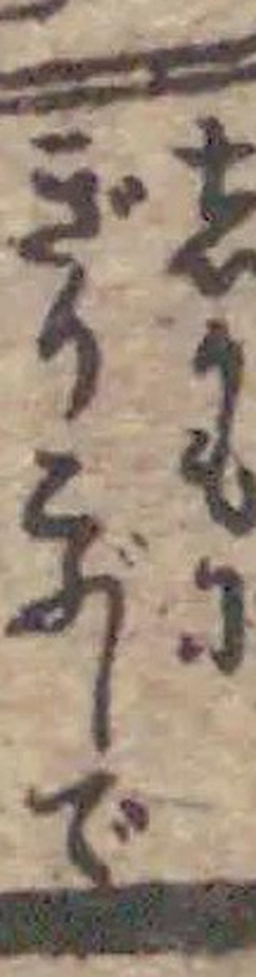ぎりこぶしで
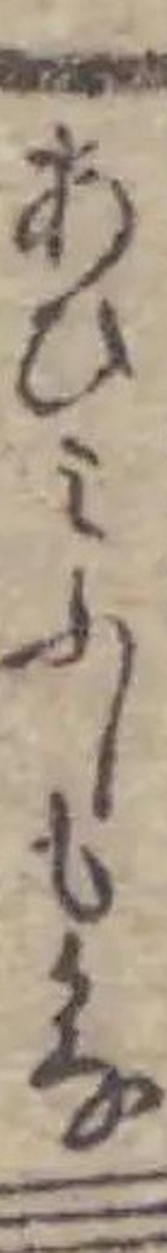あひみふしもかな
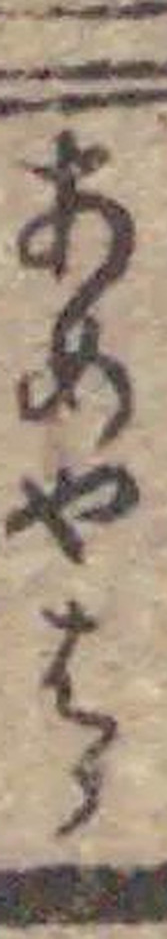あめやはら
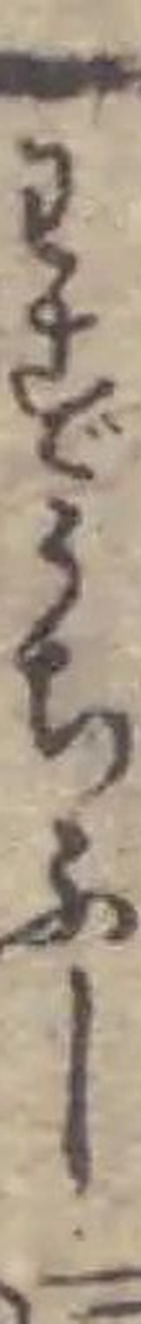わずうちふし
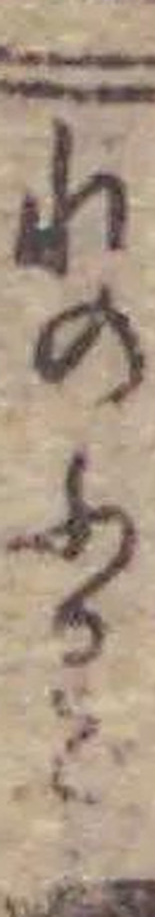れのふるご
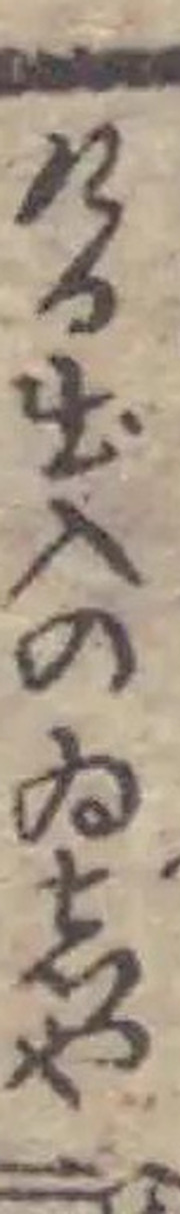ける出入のゐしや
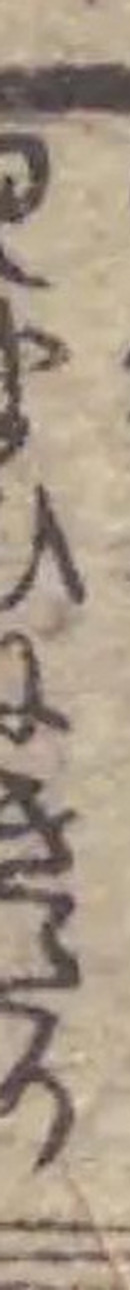見まひにきたり
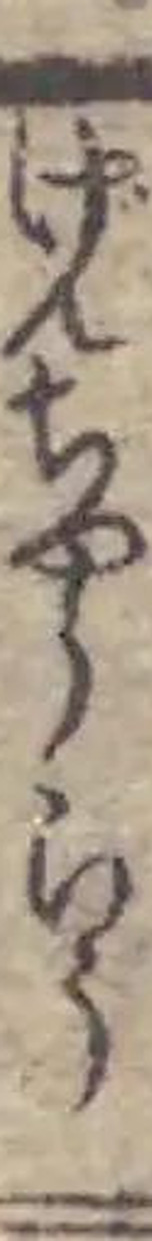げんちやうらう
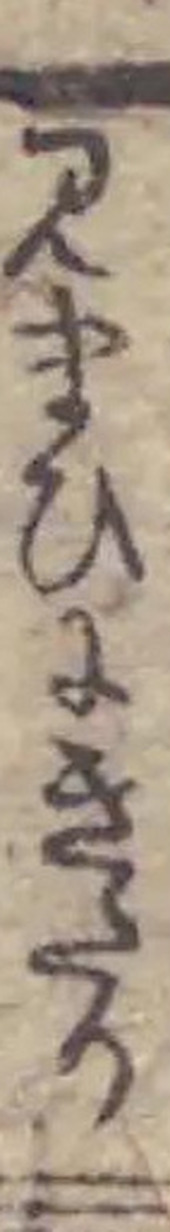見まひにきたり
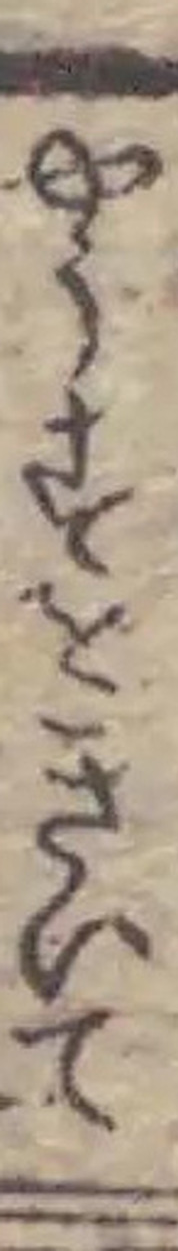やうすをきいて
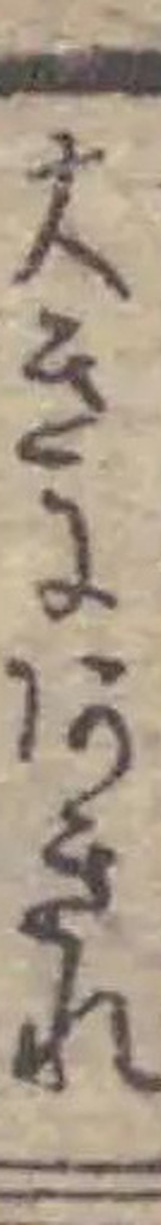大きにあきれ
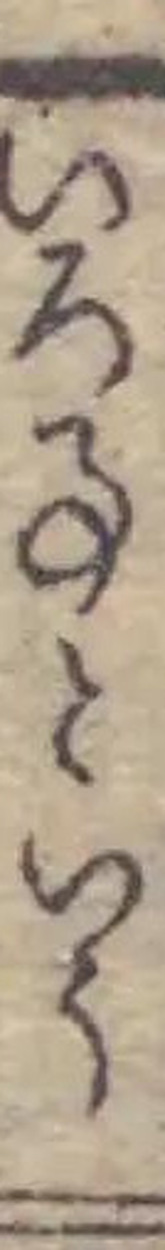いろ事という
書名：色男其処此処 3巻
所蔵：国立国会図書館 National Diet Library, JAPAN
